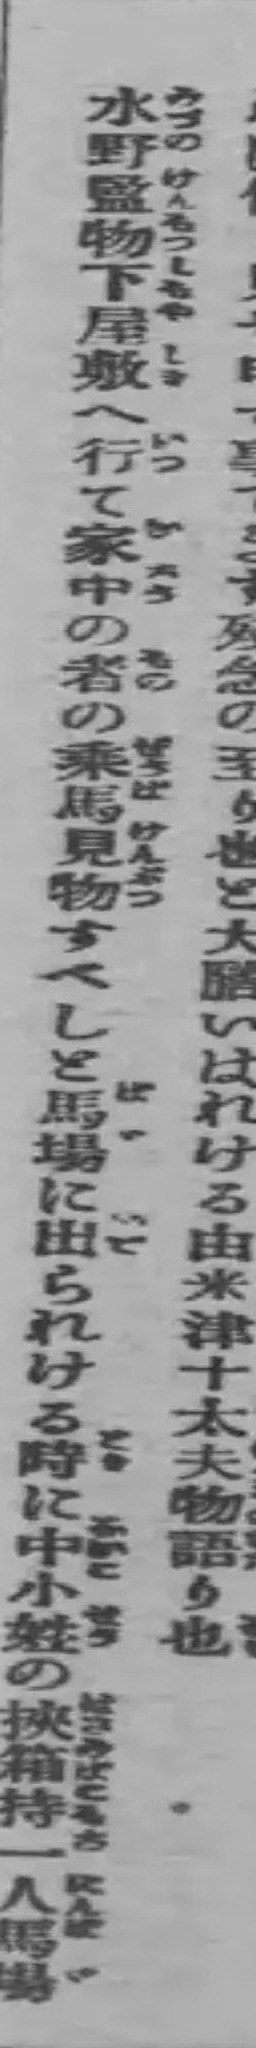水野監物下屋敷へ行て家中の者の乗馬見物すべしと馬場に出られける時に中小姓の挟箱持一人馬場
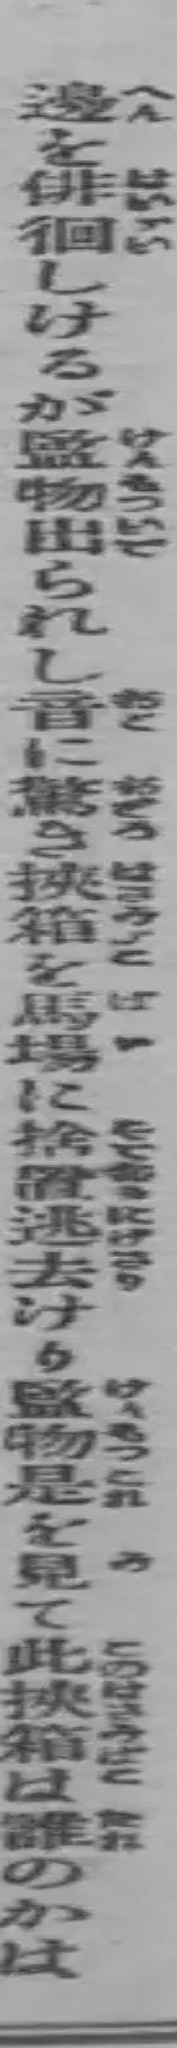辺を徘徊しけるが監物出られし音に驚き挟箱を馬場に捨置逃去けり監物是を見て此挟箱は誰のかは
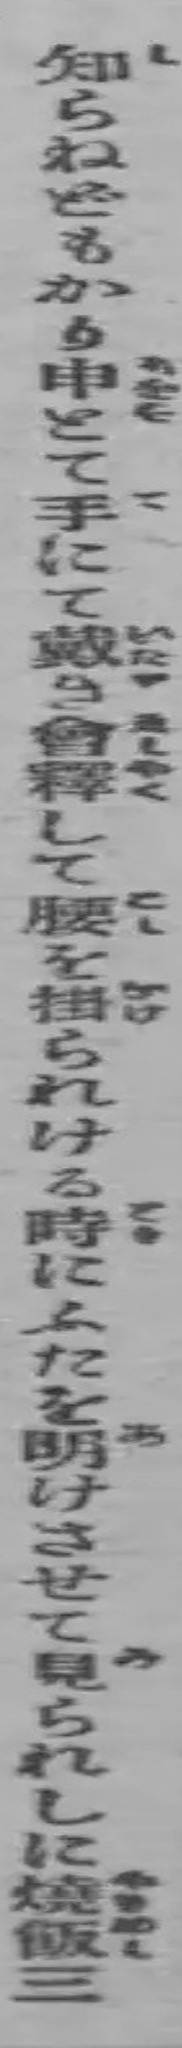知らねどもかり申とて手にて戴き会釈して腰を掛られける時にふたを明けけさせて見られしに焼飯三
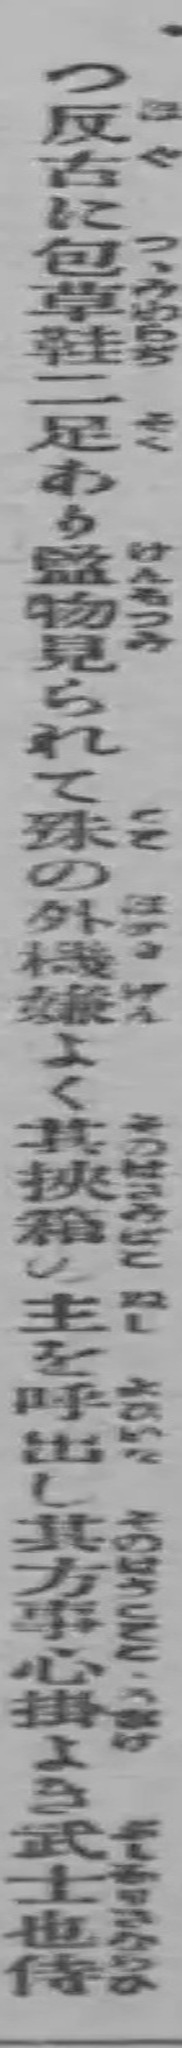つ反古に包草鞋二足あり監物見られて殊の外機嫌よく其挟箱の主を呼出し其方事心掛よき武士也侍
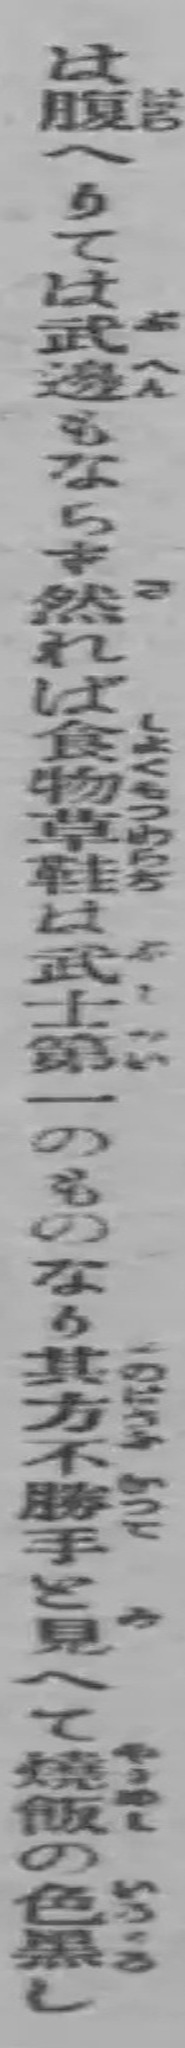は腹へりては武辺もならず然れば食物草鞋は武士第一のものなり其方不勝手と見へて焼飯の色黒し
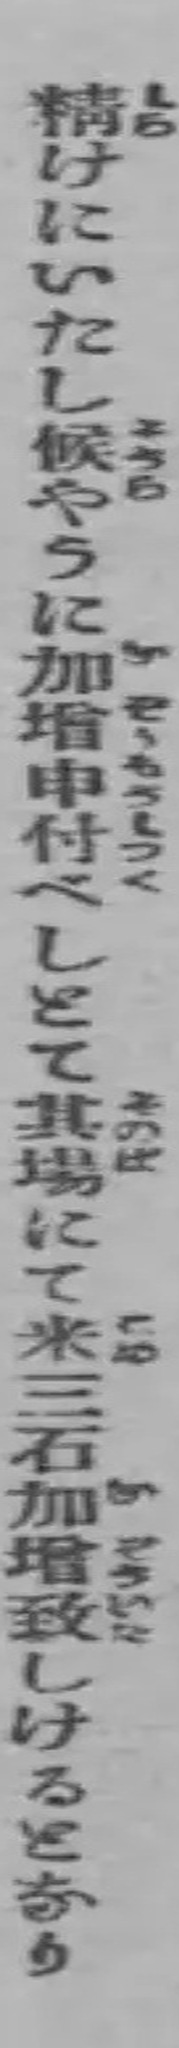精けにいたし候やうに加増申付べしとて其場にて米三石加増致しけるとなり
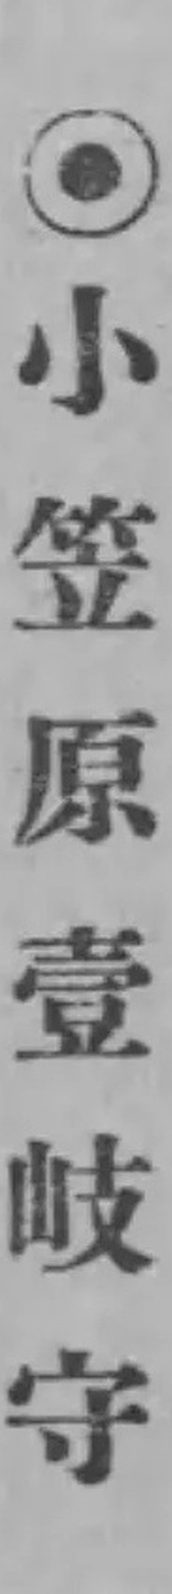⦿小笠原壱岐守
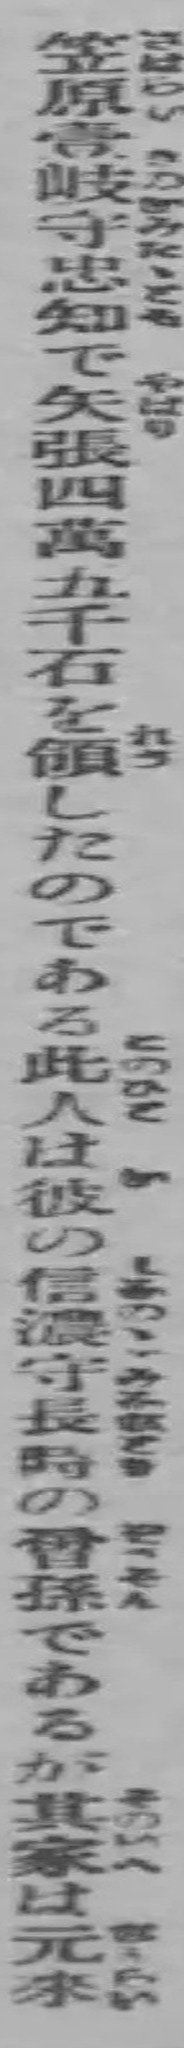笠原壱岐守忠知で矢張四万五千石を領したのである此人は彼の信濃守長時の曾孫であるが其家は元来
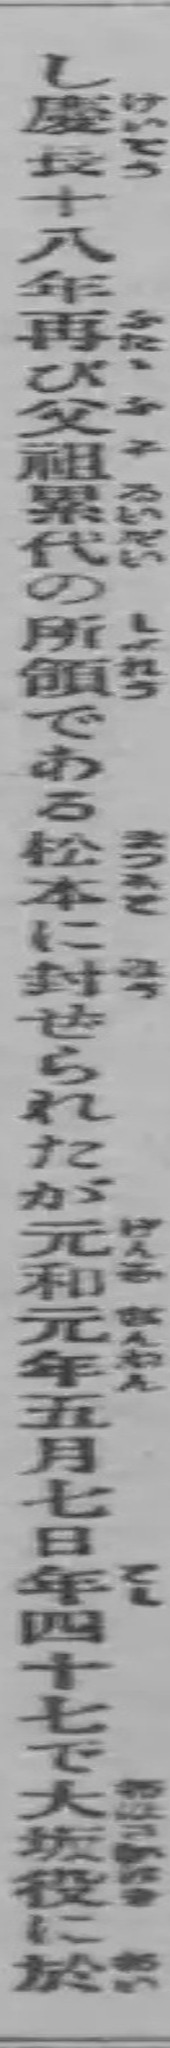し慶長十八年再び父祖累代の所領である松本に封ぜられたが元和元年五月七日年四十七で大坂役に於
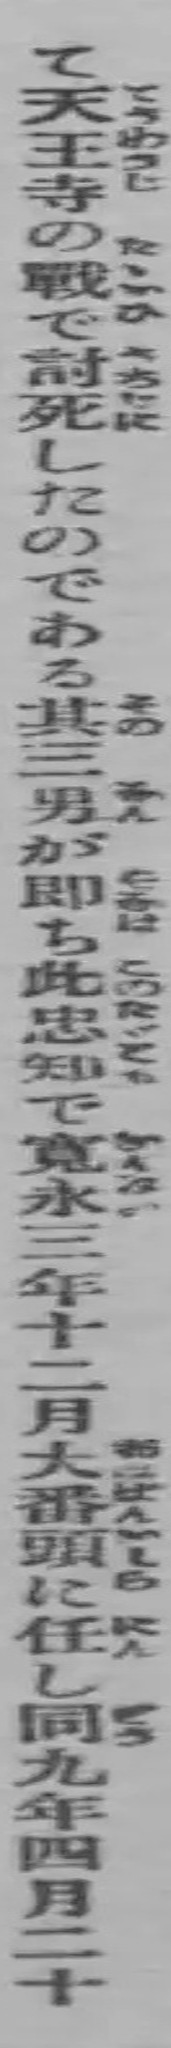て天王寺の戦で討死したのである其三男が即ち此忠知で寛永三年十二月大番頭に任し同九年四月二十
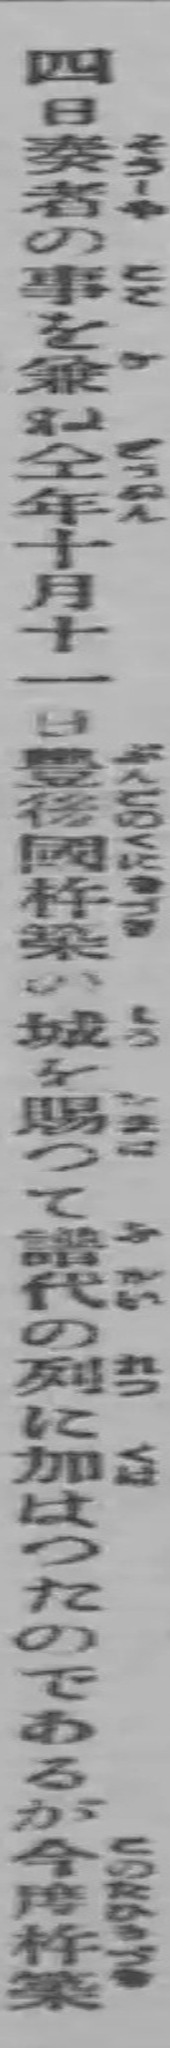四日奏者の事を兼ね仝年十月十一日豊後国杵築の城を賜つて譜代の列に加はつたのであるが今度杵築
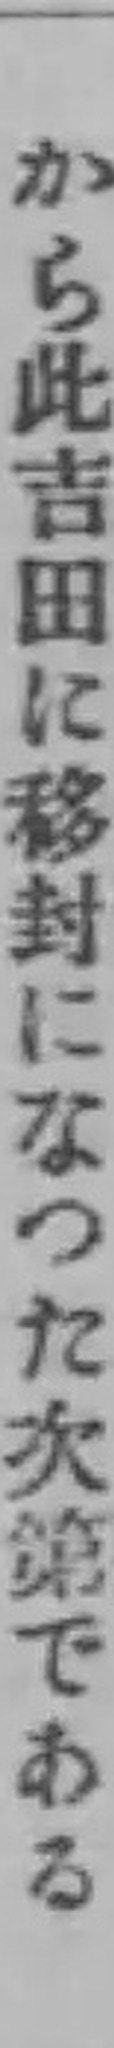から此吉田に移封になつた次第である
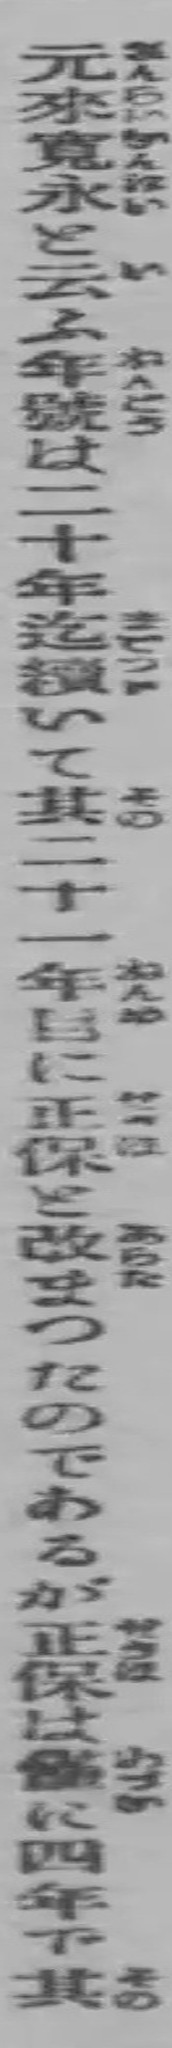元来寛永と云ふ年号は二十年迄続いて其二十一年目に正保と改まつたのであるが正保は僅に四年で其
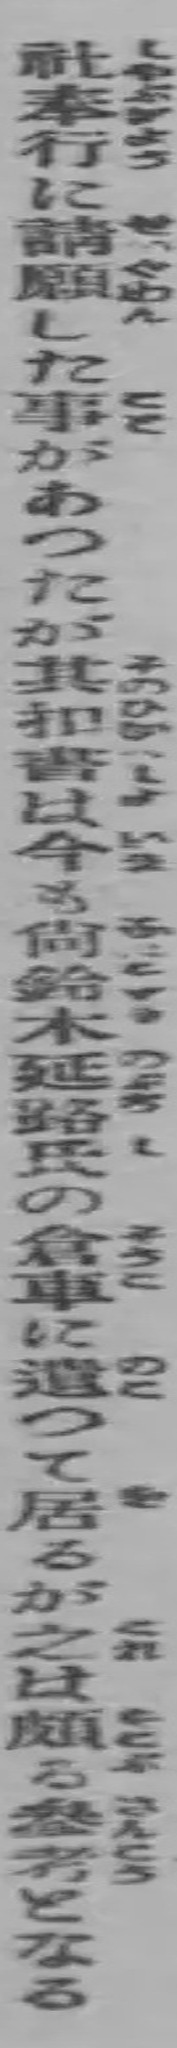社奉行に請願した事があつたが其扣書は今も尚鈴木延路氏の倉車に遺つて居るが之は頗る参考となる

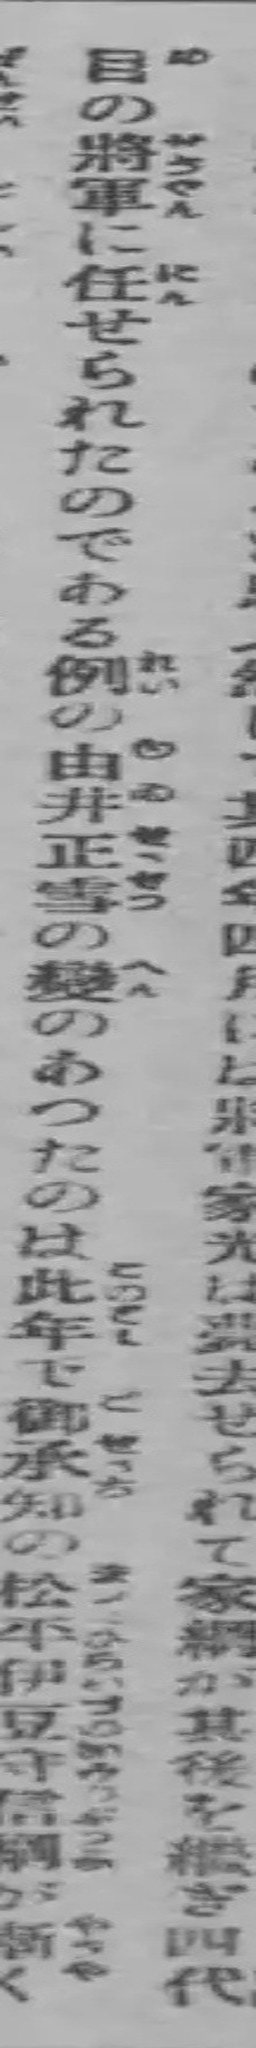目の将軍に任せられたのである例の由井正雪の変のあつたのは此年で御承知の松平伊豆守信綱が漸く
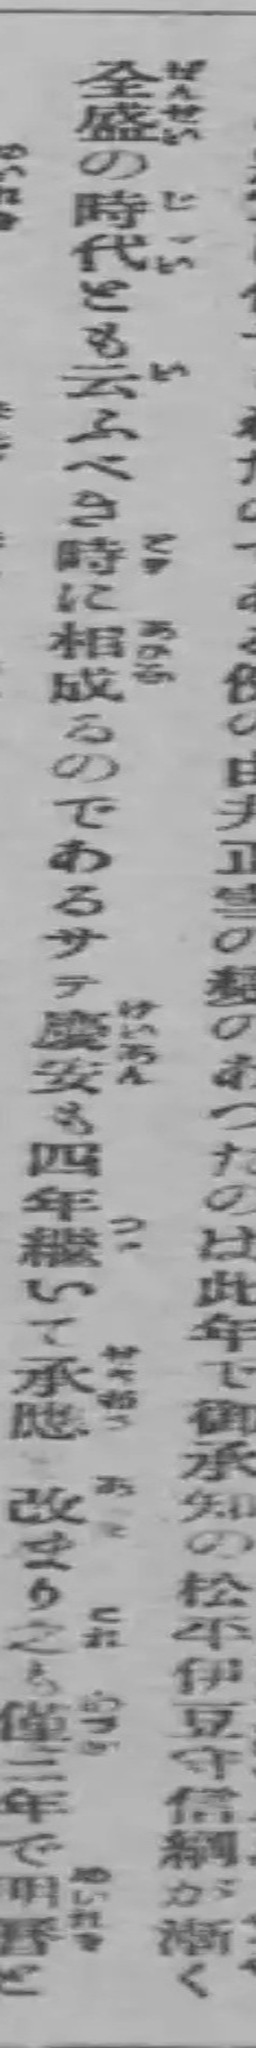全盛の時代とも云ふべき時に相成るのであるサテ慶安も四年継いて承応と改まり之も僅二年で明暦と
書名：豊橋市史談
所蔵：国立国会図書館 National Diet Library, JAPAN
